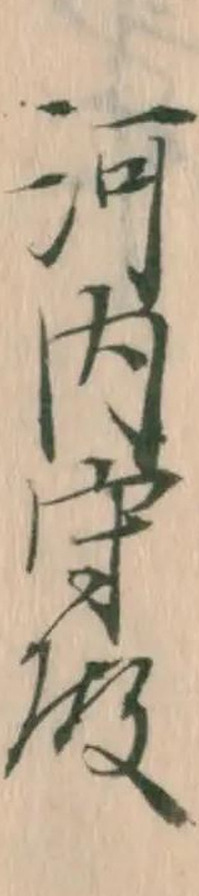河内守殿
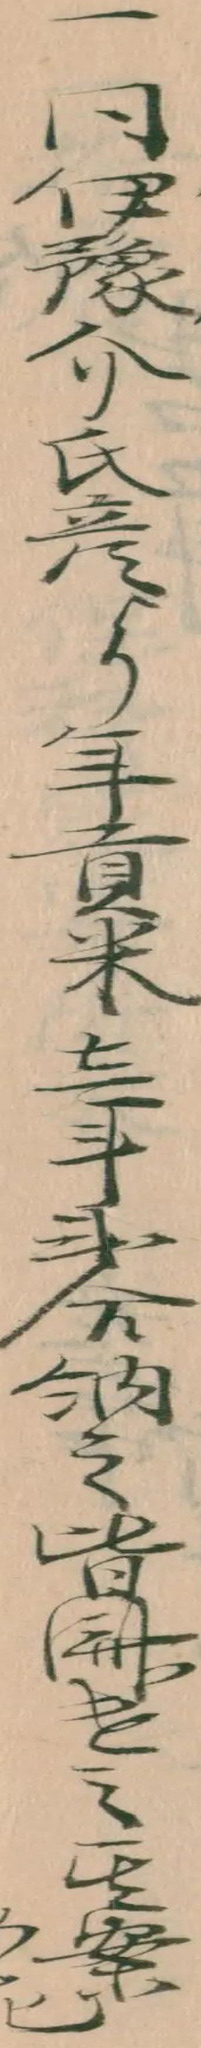一同伊豫介氏彦より年貢米壱斗弐合納之皆済遣之其案如左
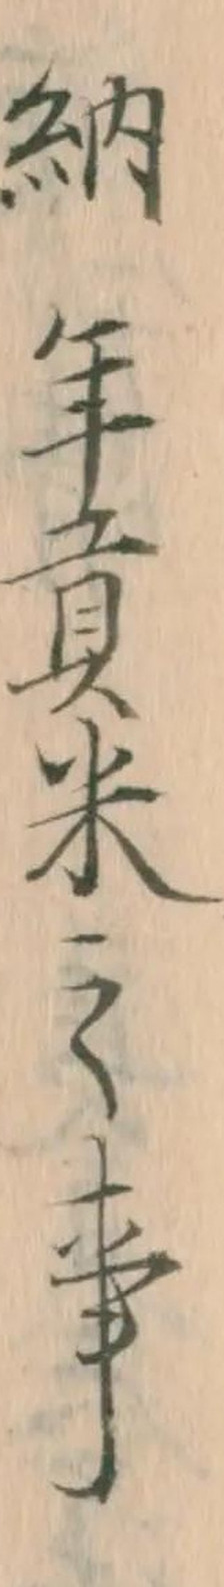納年貢米之事
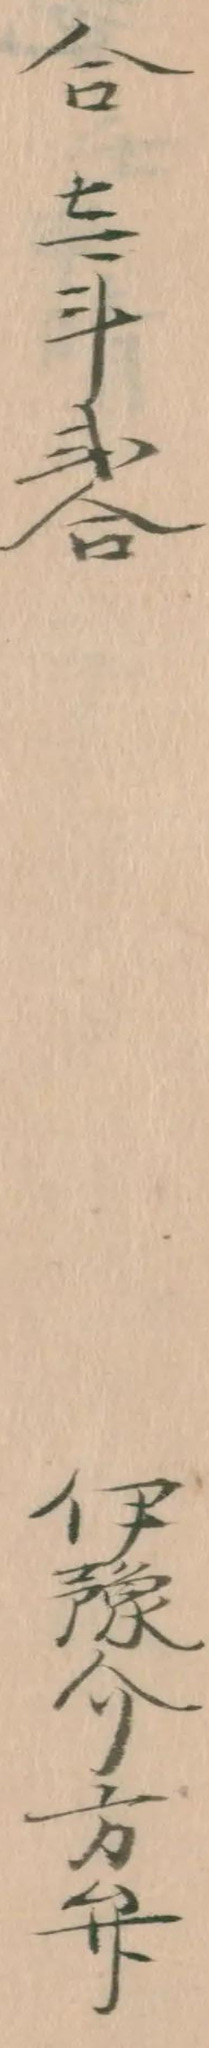合壱斗弐合伊豫介方弁
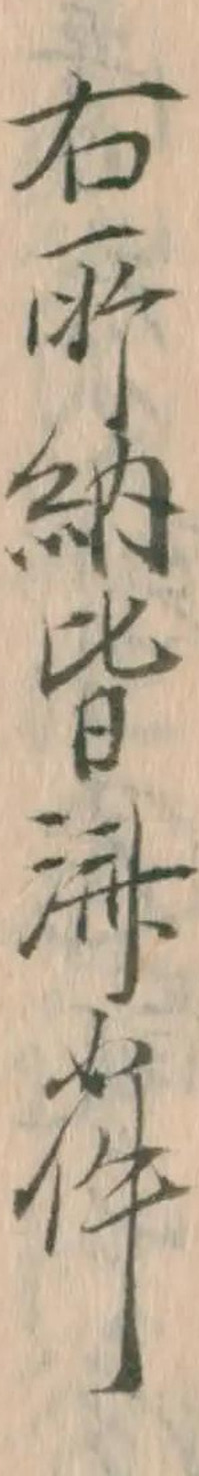右所納皆済如件
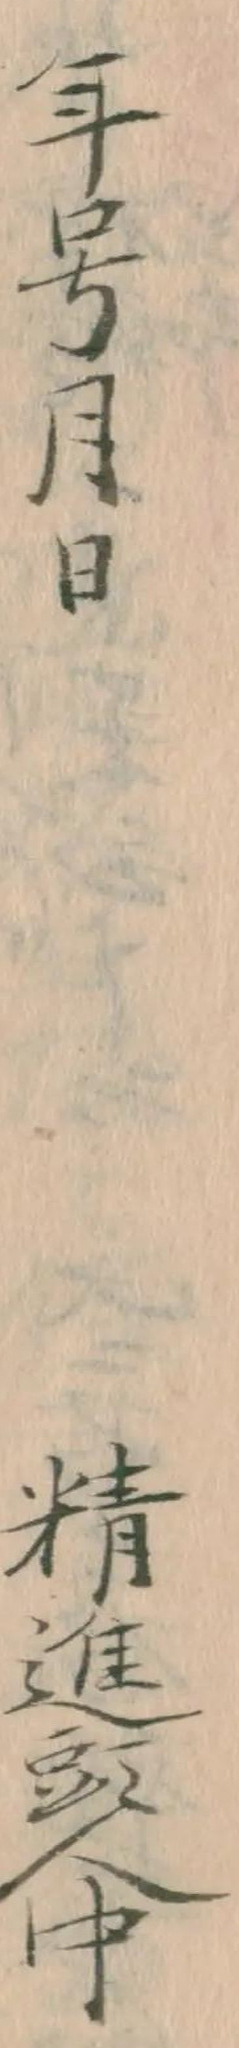年号月日精進頭人中
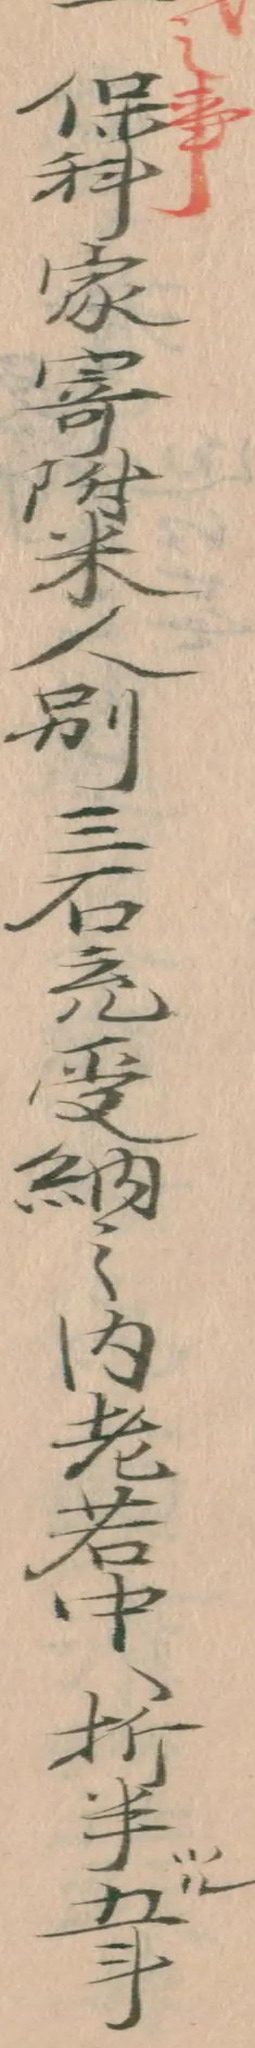一保科家寄附米人別三石充受納之内老若中へ折半ツル五斗
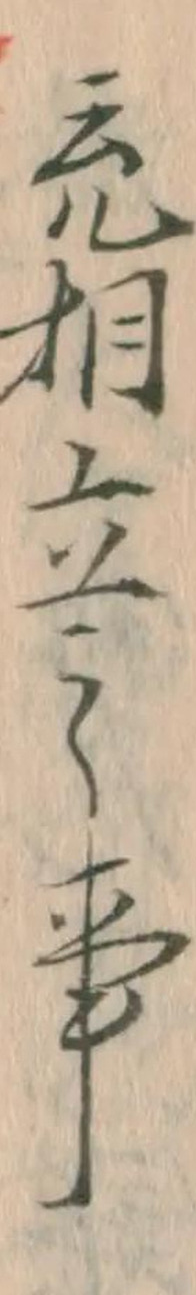充相立之事
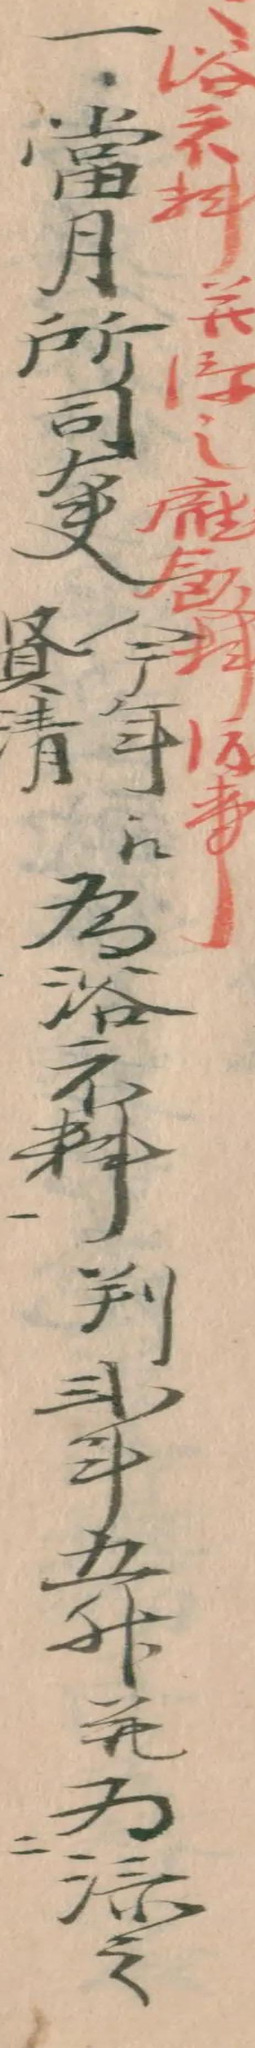一當月所司大夫今年え賢清為浴衣料判弐斗五升并為添之
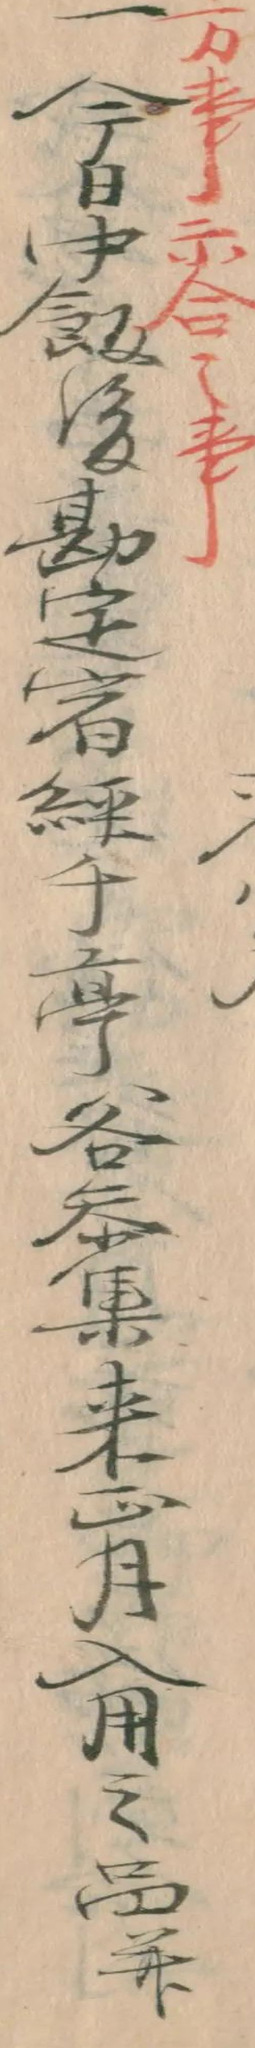一今日中飯後勘定宿経千亭各参集来正月入用之品并
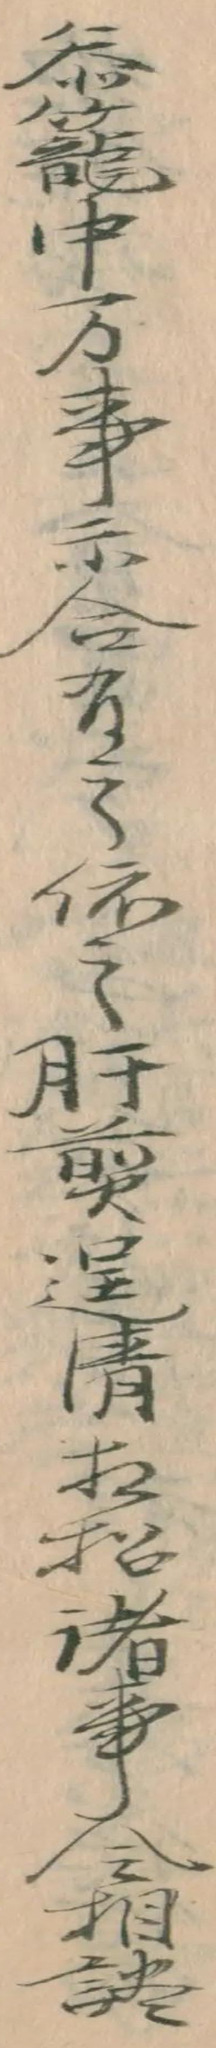参籠中万事示合有之依之肝煎逞清相招諸事令相談

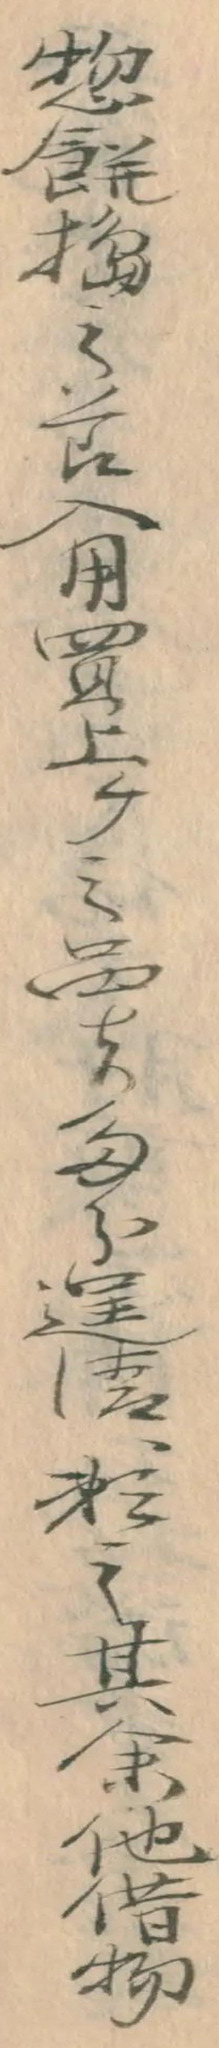惣餅搗之節入用買上ケ之品は多分逞清頼之其余他借物
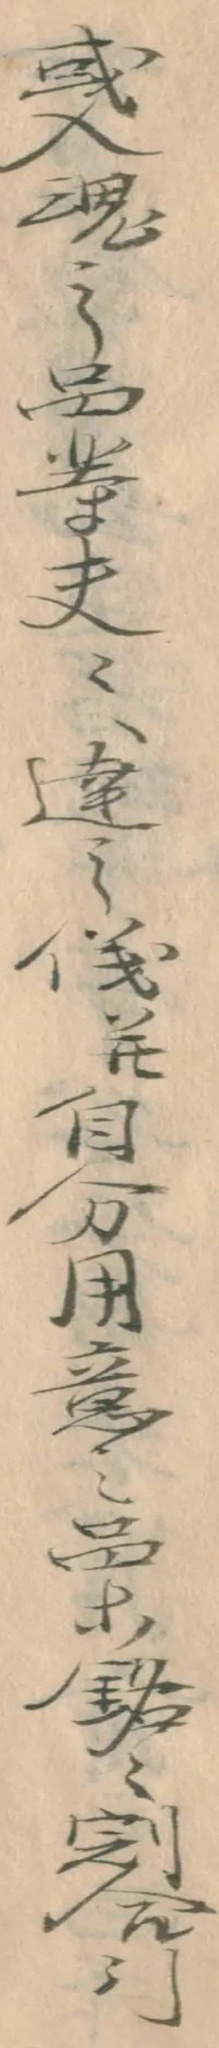或入魂之品等夫々へ達之儀并自分用意之品等銘々割合引
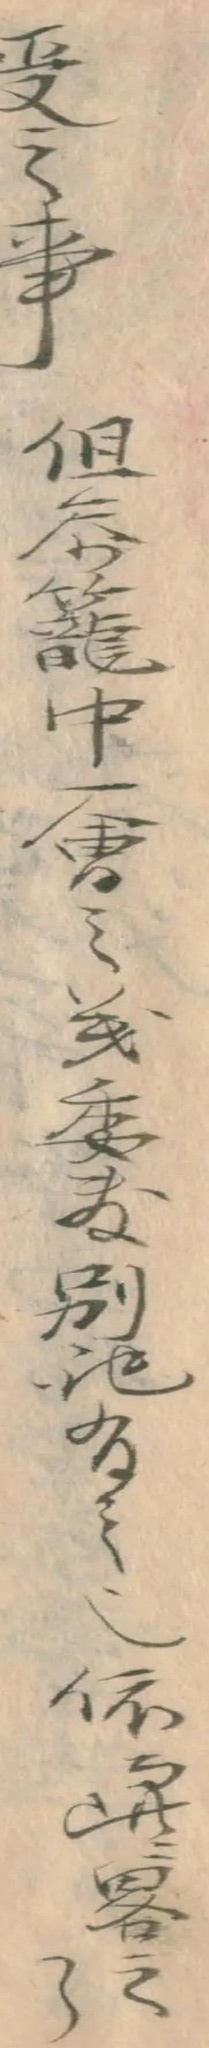受之事但参籠中一會之義委敷別記有之也依而此畧之也
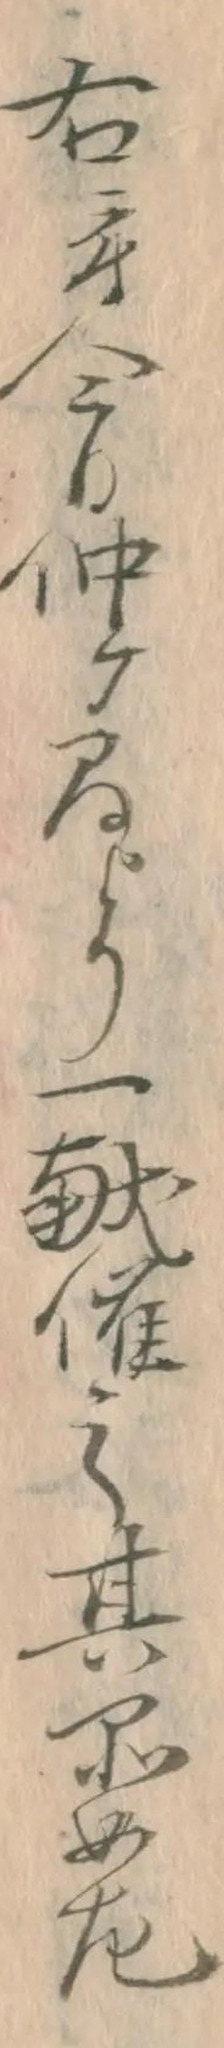右ニ付今日仲ヶ間より一献催之其品如左
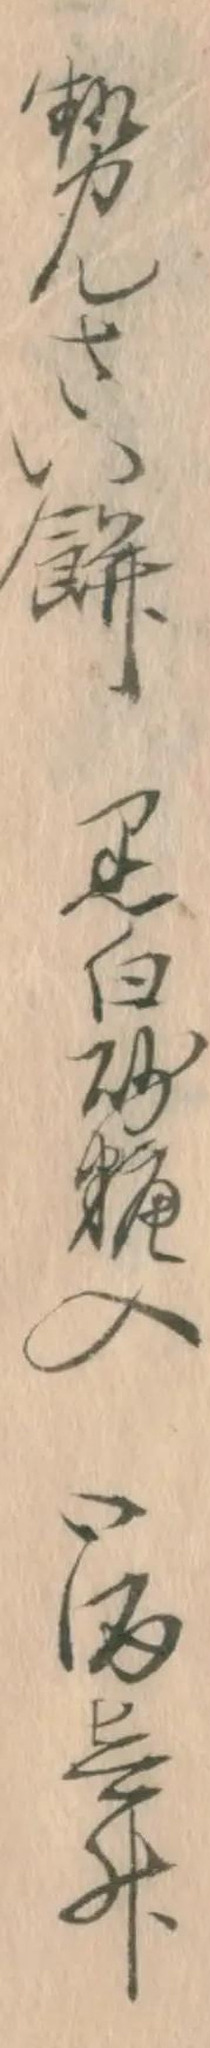せんさい餅黒白砂糖入御酒壱升
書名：賀茂社記録. 第74冊
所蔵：国立国会図書館 National Diet Library, JAPAN
